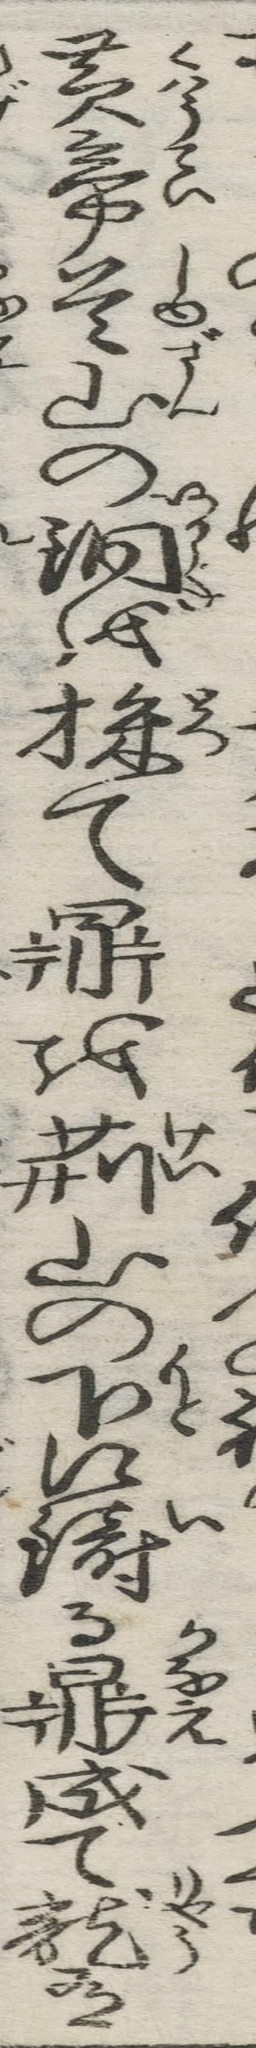黄帝首山の銅を採て鼎を荊山の下に鋳る鼎成て龍有
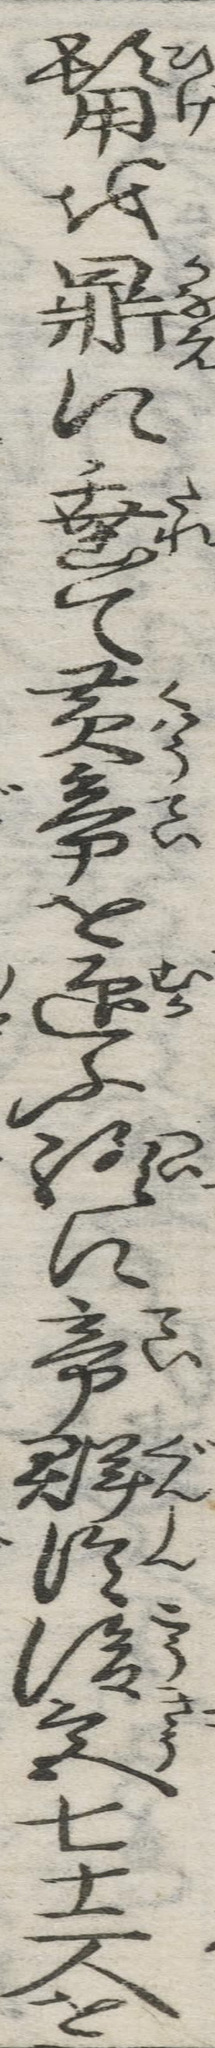髯を鼎に垂て黄帝を迎ふ遂に帝群臣後宮七十二人を
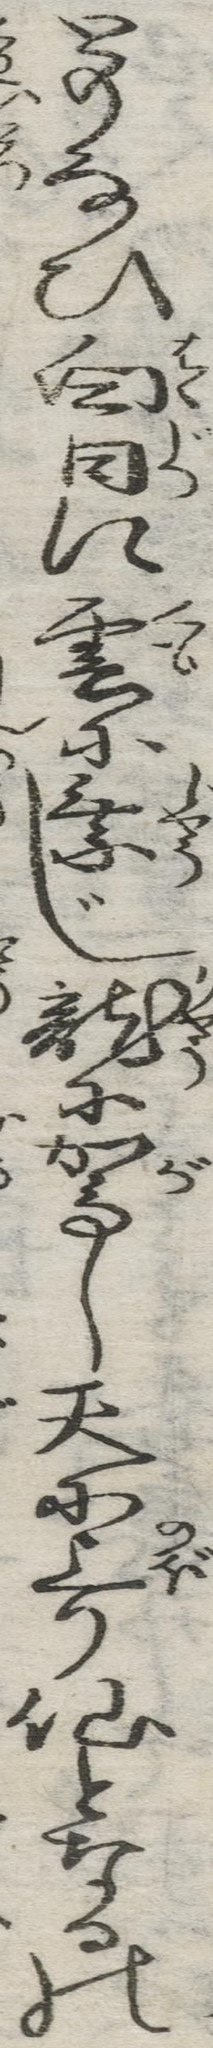ともなひ白日に雲に乗じ龍に駕し天に上り仙となるの
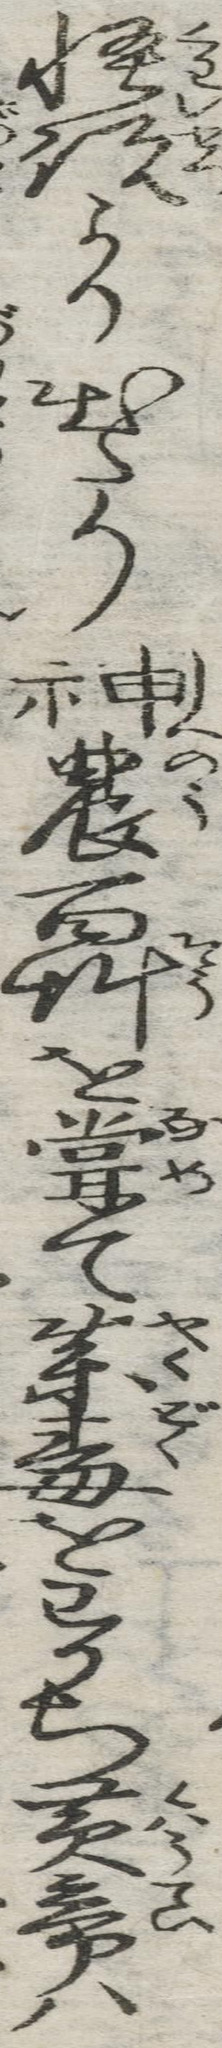怪説より出たり神農百艸を甞て薬毒をわかち黄帝は
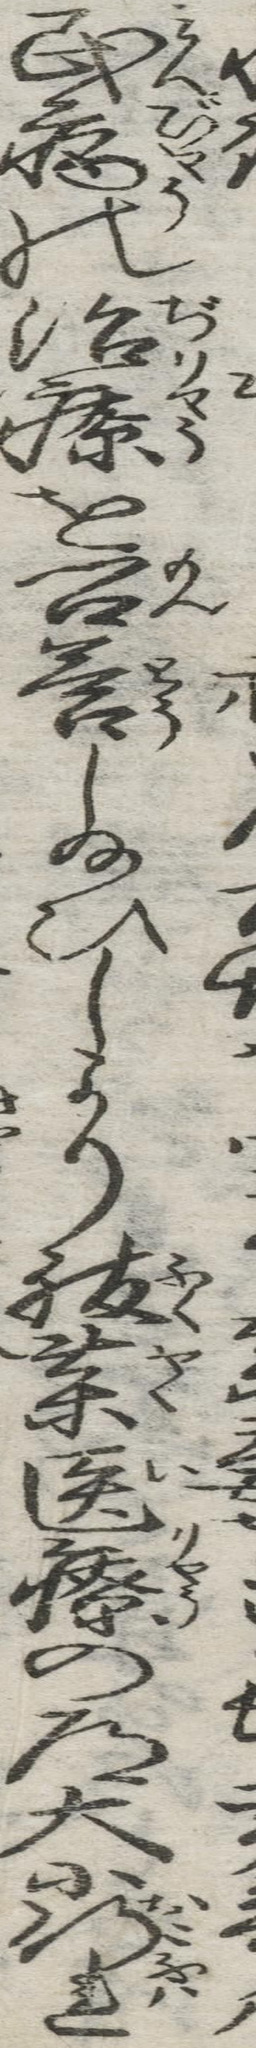民病の治療を問答しなひしより服薬医療の道大に行れ
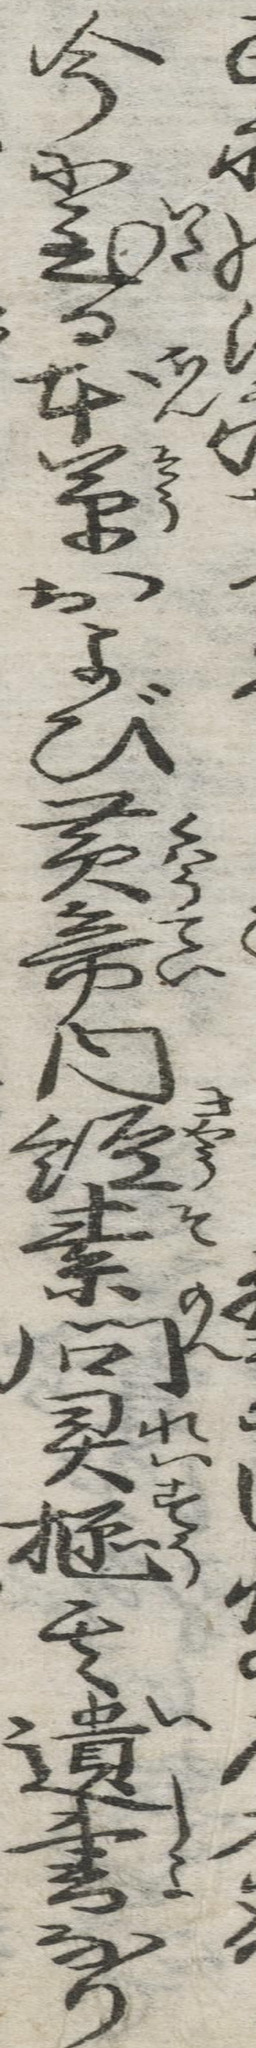今に至る本草および黄帝内経素問㚑枢其遺書なり
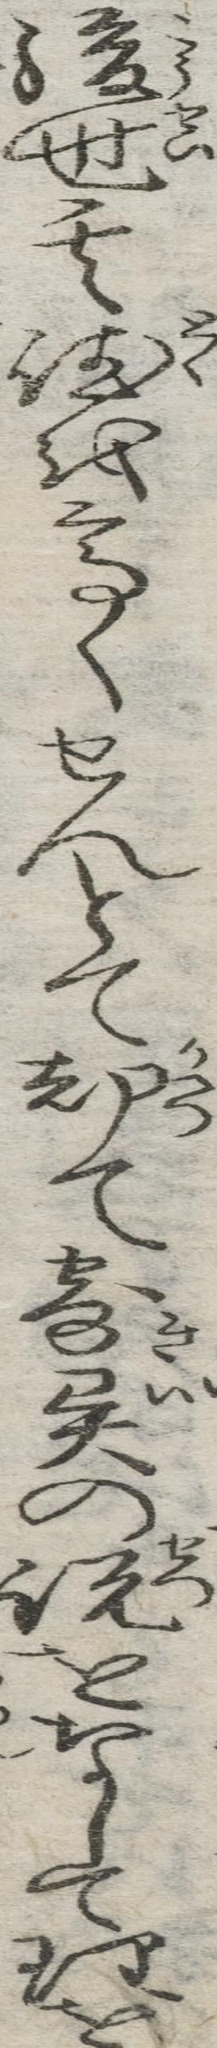後世其徳を高くせんとて却て奇異の説となして理を
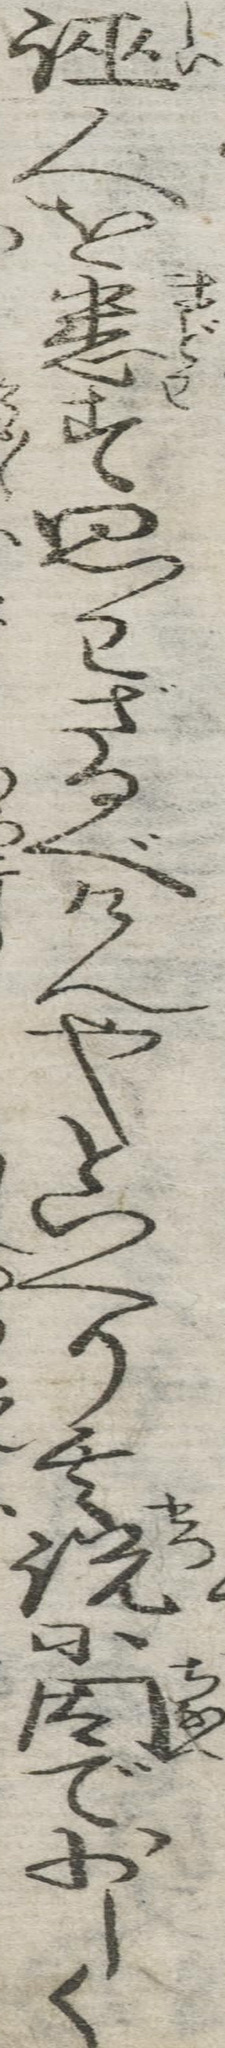誣人を患す思わざるべけんやといへり其説に因で少しく
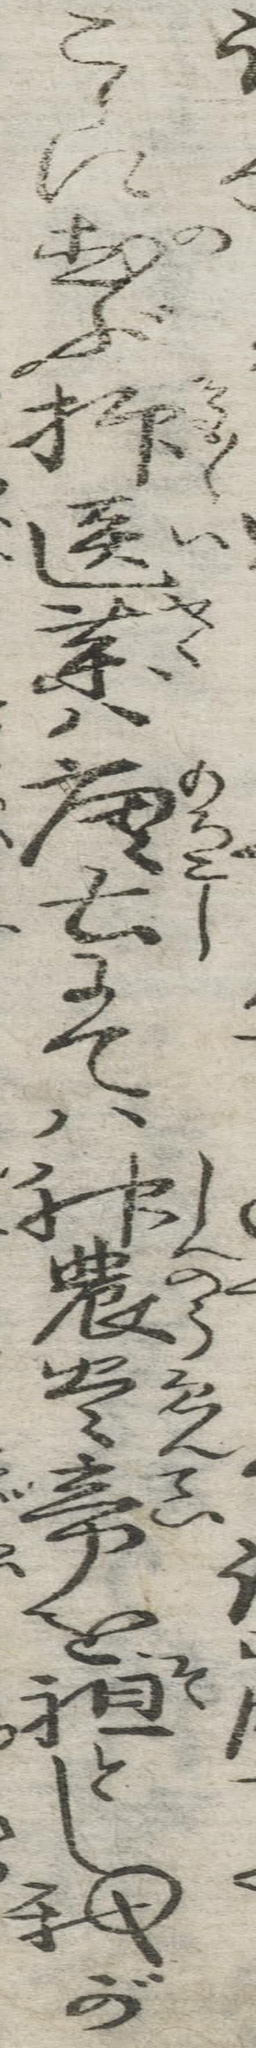こゝに述ぶ抑医薬は唐土にては神農炎帝を祖とし我が
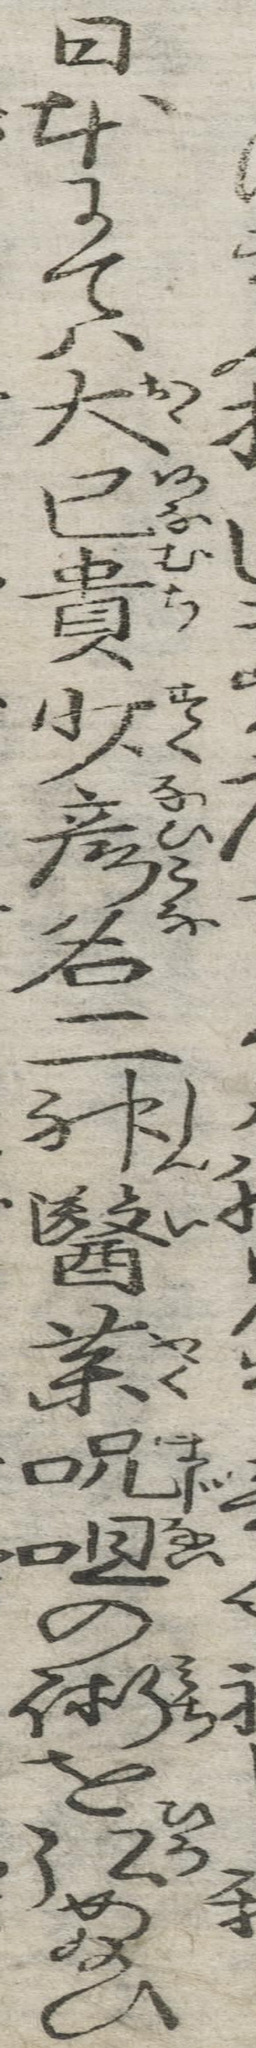日本にては大巳貴少彦名二神醫薬呪唄の術を弘めなひ
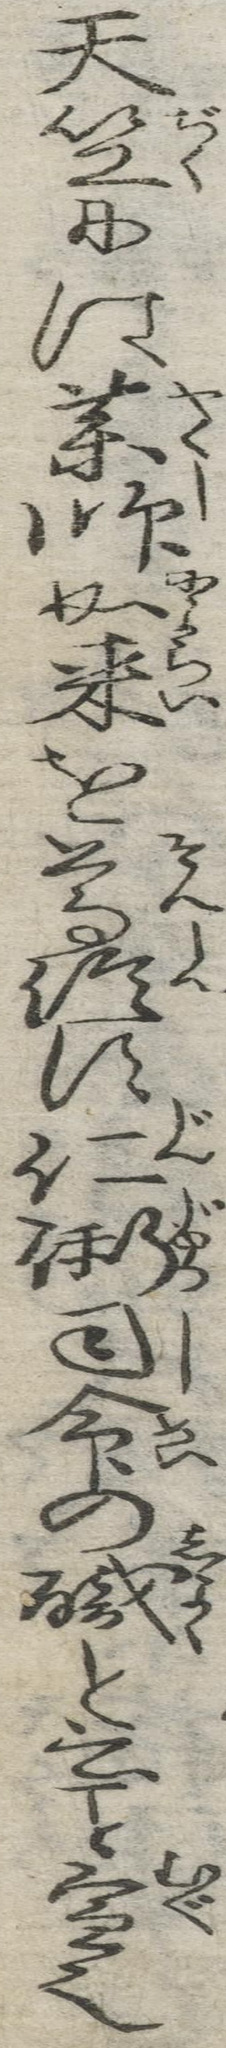天竺には薬師如来を尊信す仁術司命の職と云こと宣也

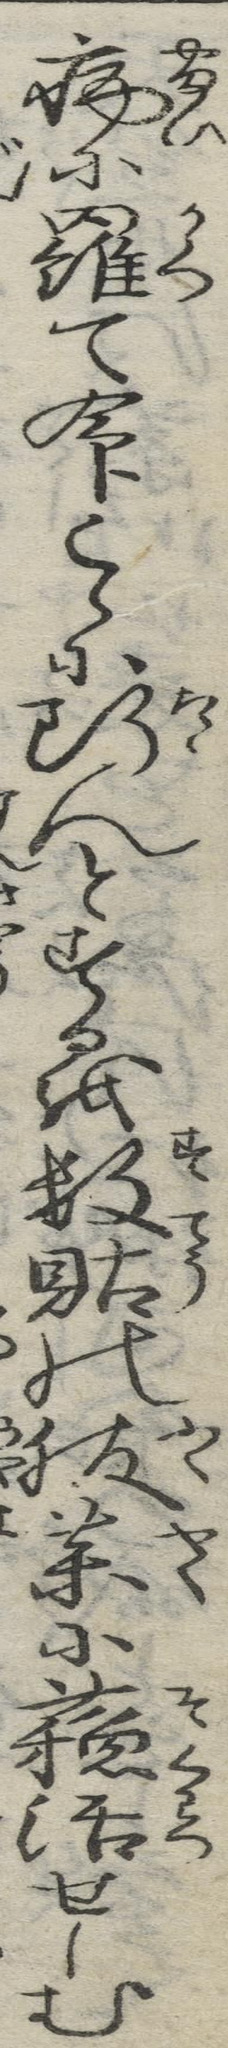病に罹て命こゝに断んとするを数貼の服薬に蘇活せしむ
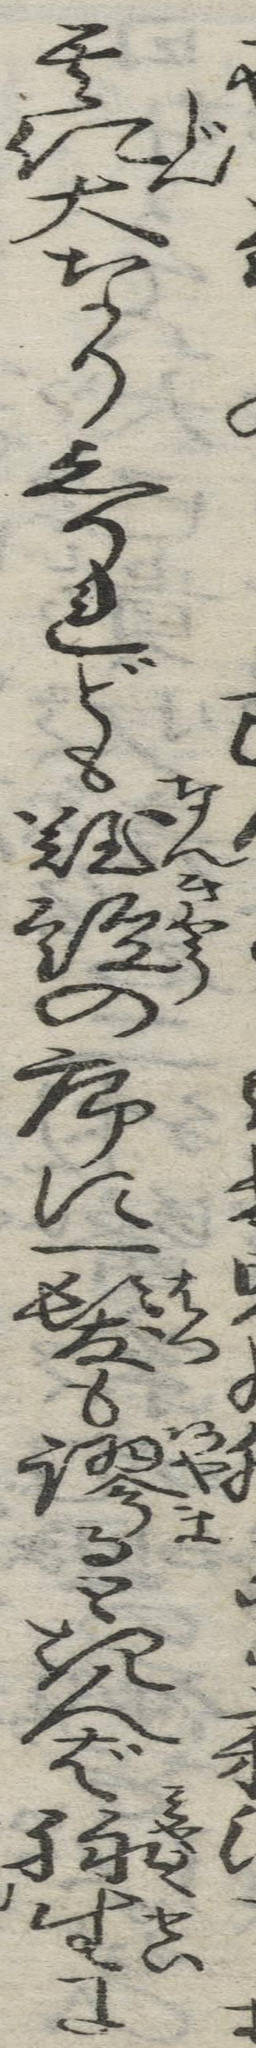其仁大なりしかれども難経の序に一髪も繆るときんば脈生に
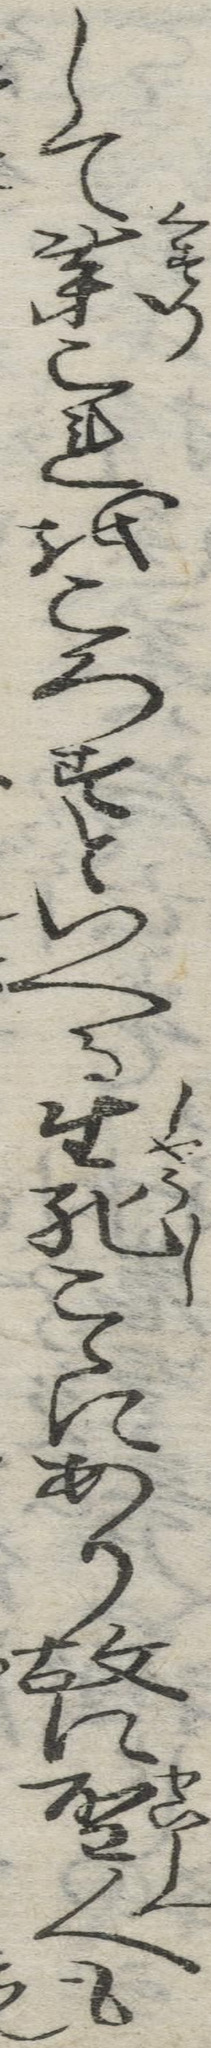して薬これをころすといへる生死こゝにあり故に聖人も
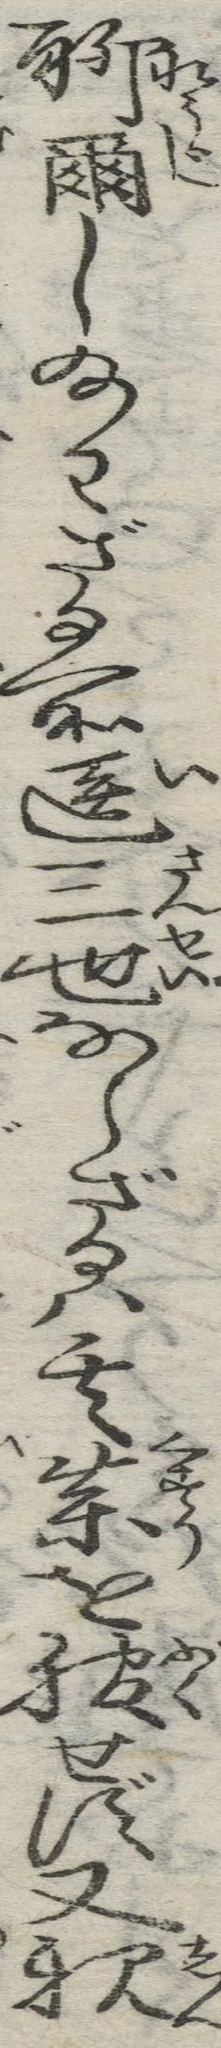聊爾しなさざる所医三世ならざるは其薬を服せず又親
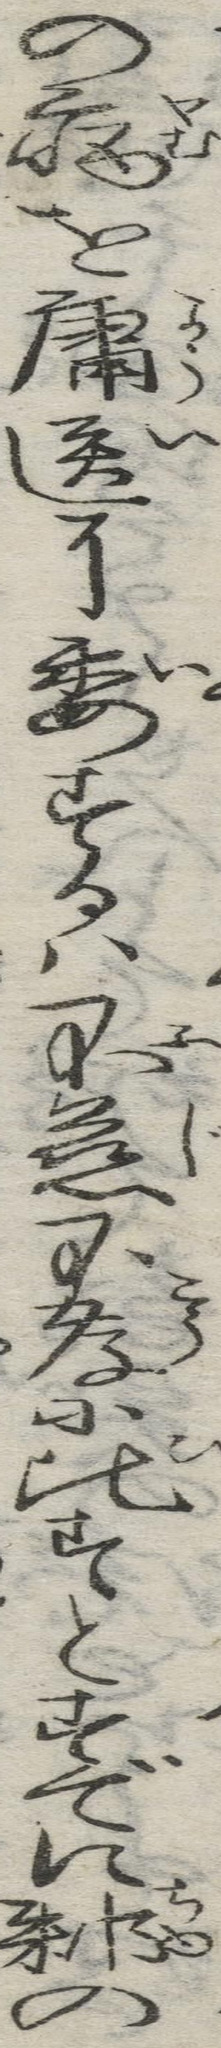の病を庸医に委するは不慈不孝に比すとすでに邾の
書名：訓蒙天地辨　人
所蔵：東京大学地震研究所図書室 Earthquake Research Institute Library, The University of Tokyo, JAPAN
